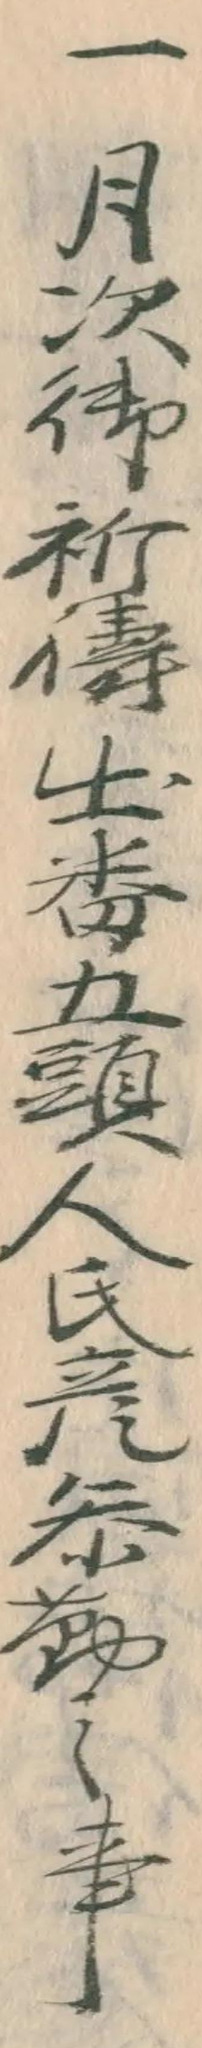一月次御祈祷出番五頭人氏彦参勤之事
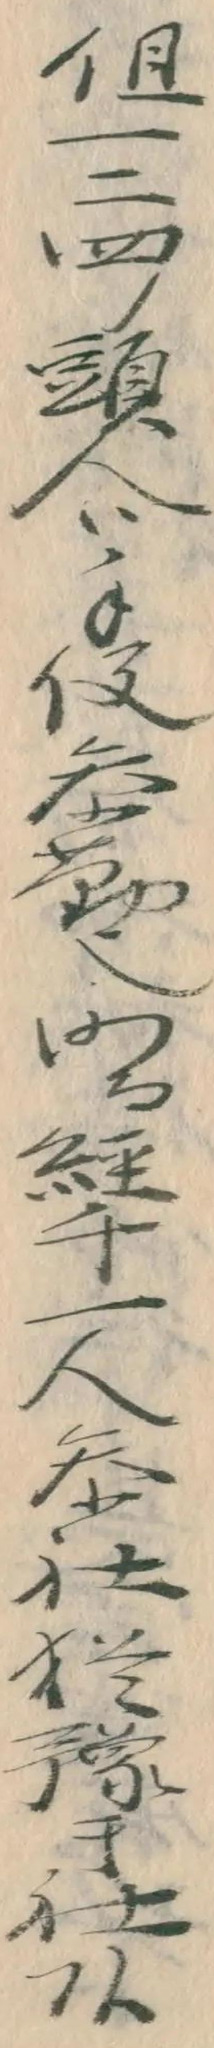但一二四ノ頭人ハ手役参勤也仍而経千一人参社猶豫其社頭

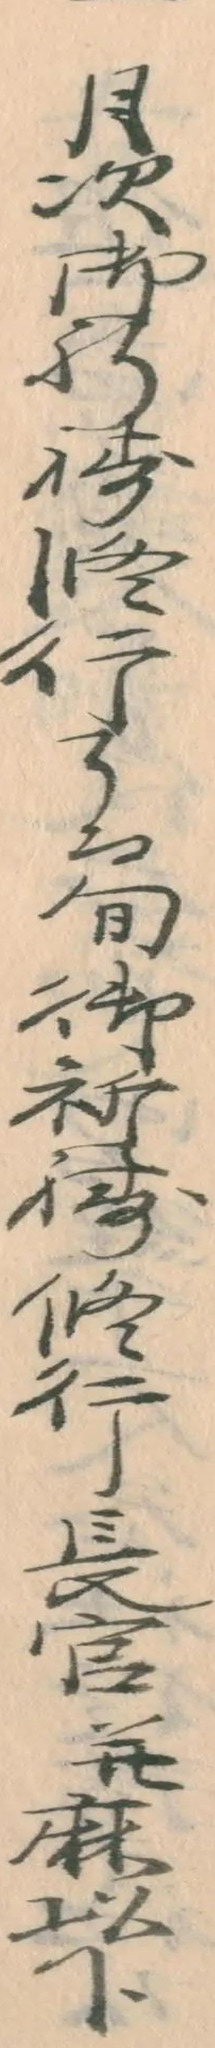一月次御祈祷修行了而御祈禱修行長官并麻以下
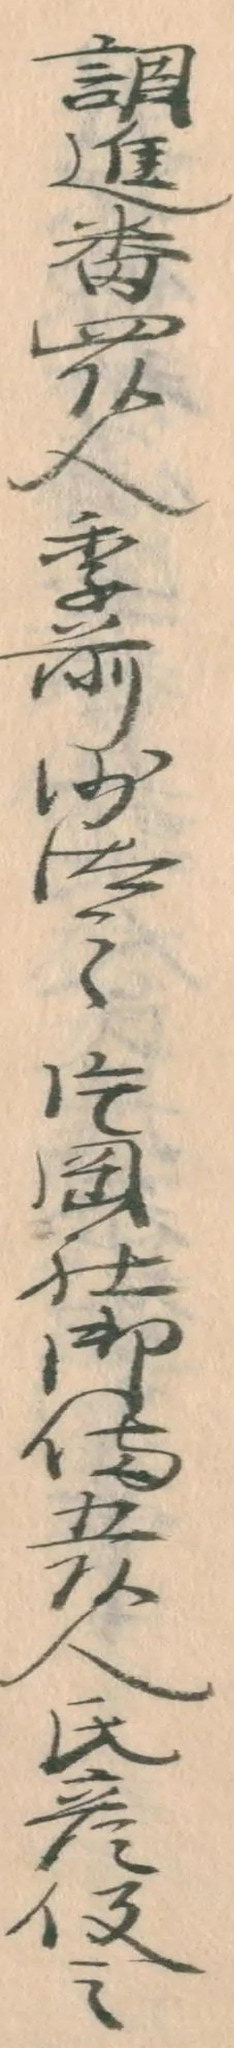調進番四頭人季前沙汰之片岡社御備五頭人氏彦役之
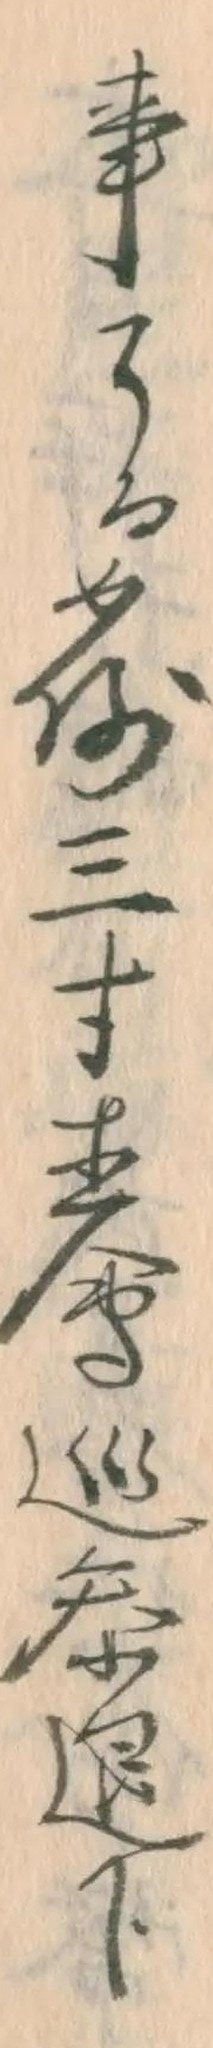事了而如例三寸直會巡参退下
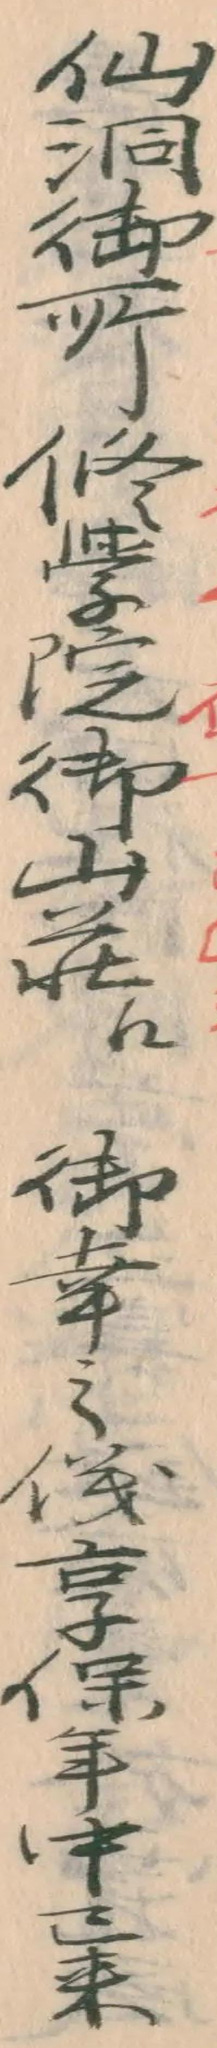一仙洞御所修學院御山荘え御幸之儀享保年中已来
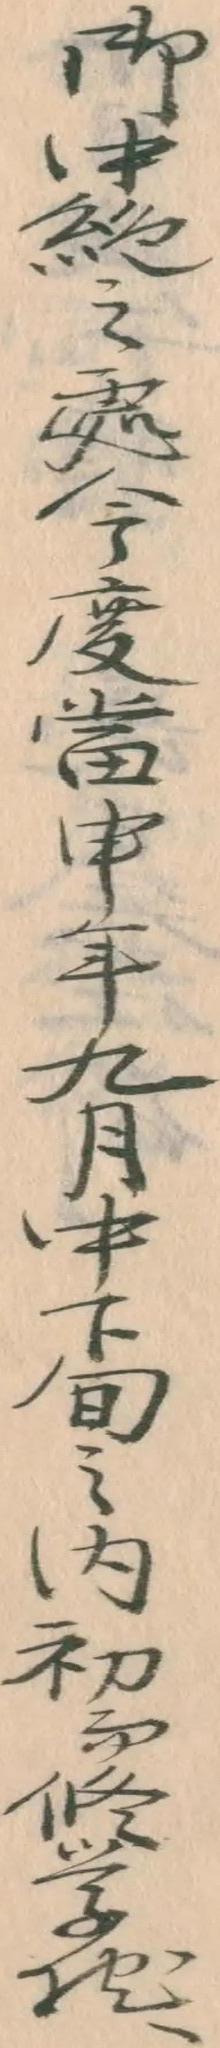御中絶之處今度當申年九月中下旬之内初而修学院へ
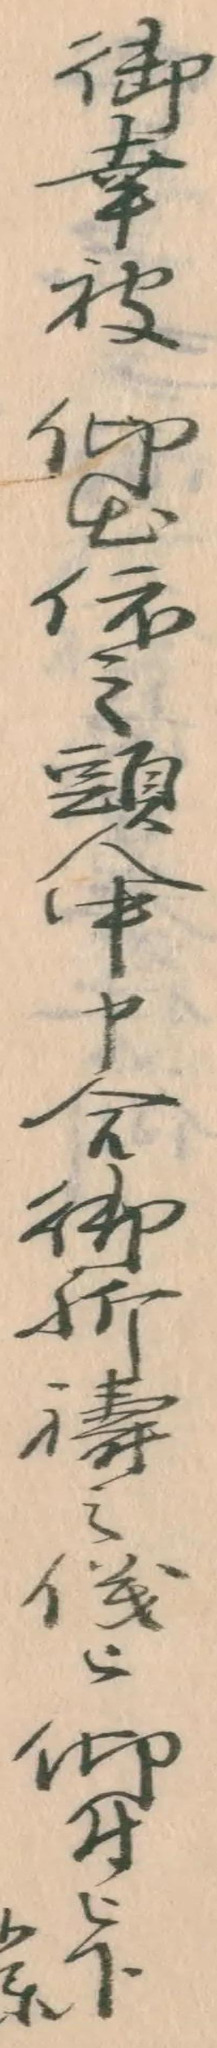御幸被仰出依之頭人中申合御祈祷之儀被仰付被下候様
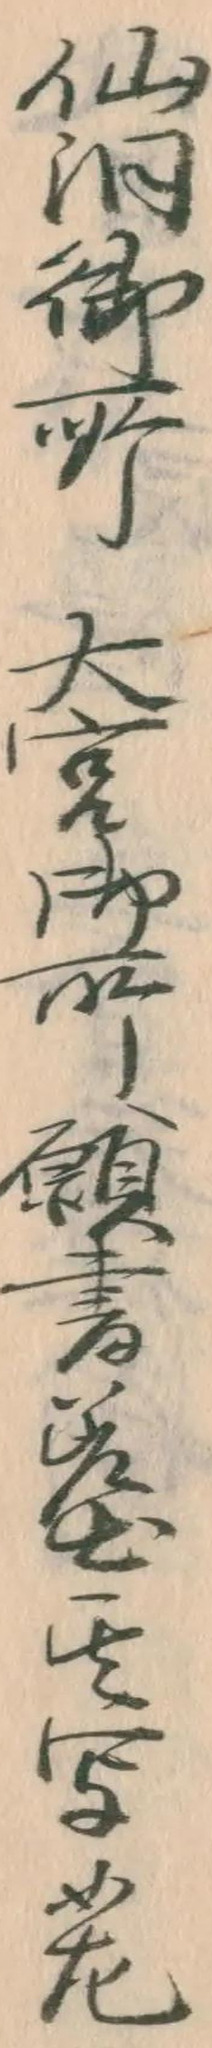仙洞御所大宮御所へ願書差出其写如左
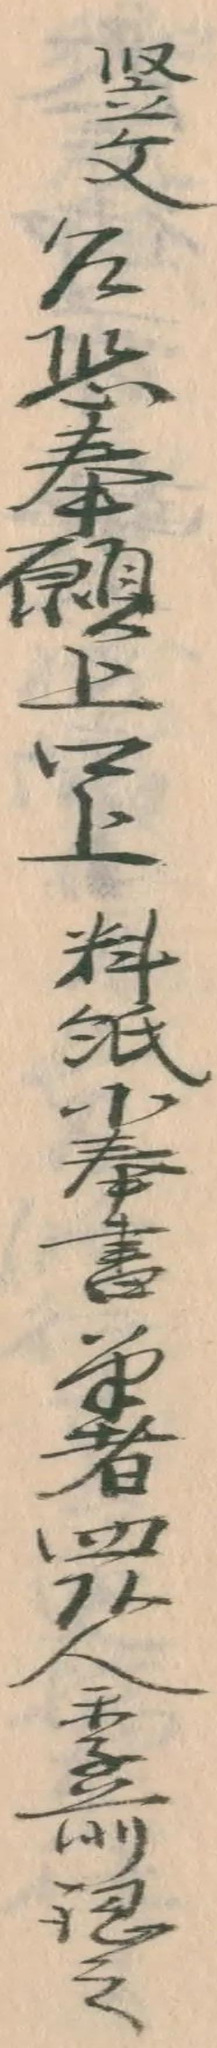竪文乍恐奉願上口上料紙小奉書筆者四頭人季前認之
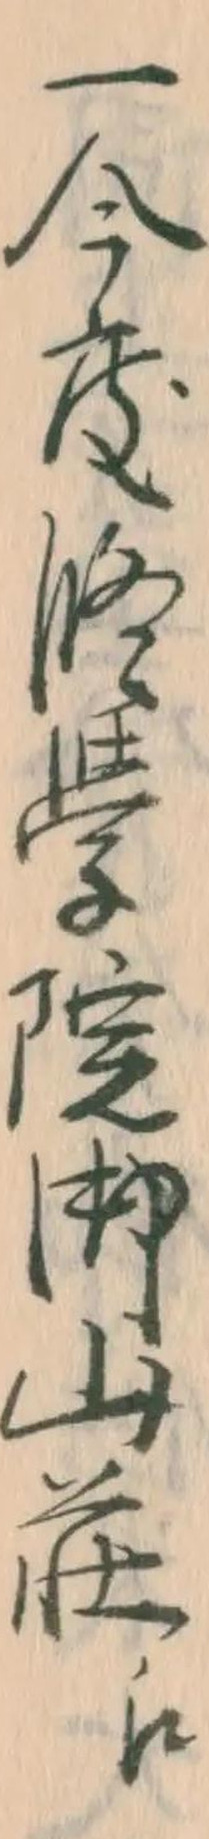一今度修學院御山荘え
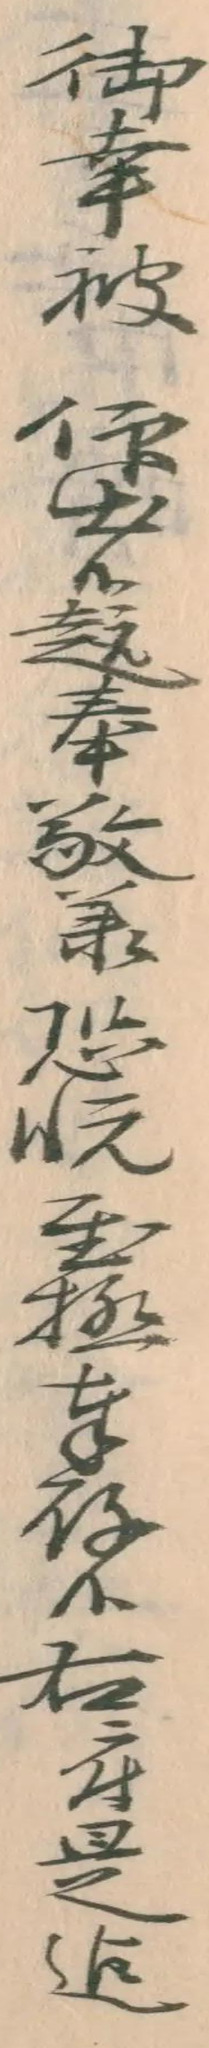御幸被仰出候趣奉敬承恐悦至極奉存候右ニ付是迄
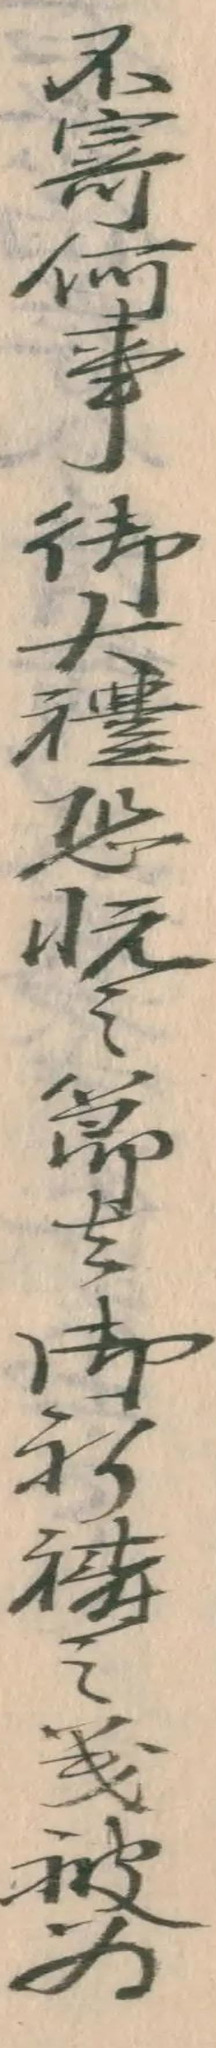不寄何事御大禮恐悦之節は御祈祷之義被為
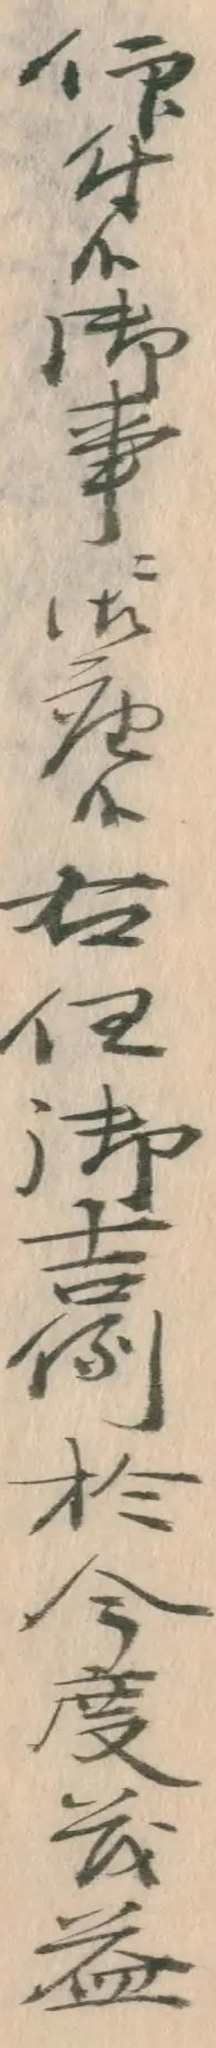仰付候御事ニ御座候右任御吉例於今度義益
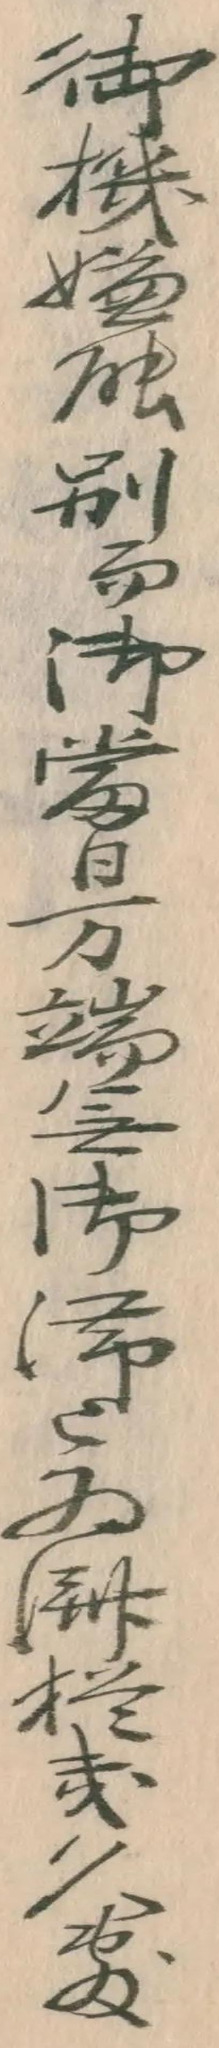御機嫌能別而御當日万端無御滞被為済於義久敷
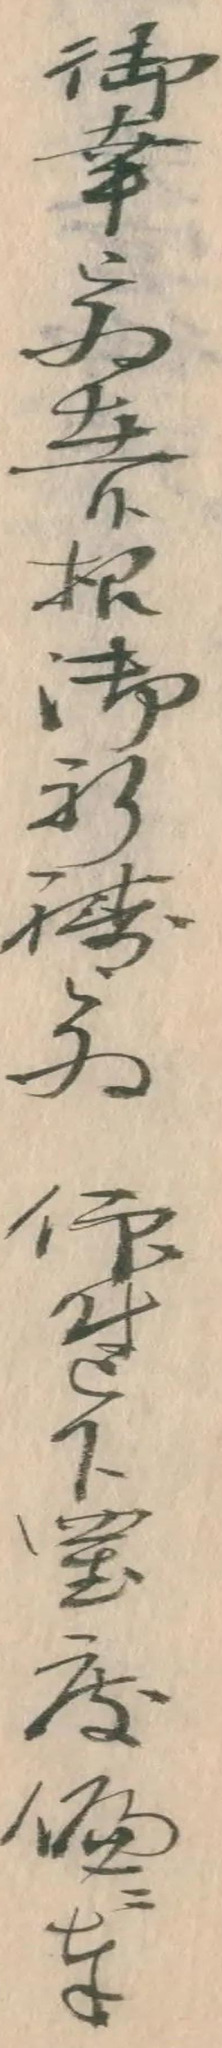御幸被為在候様御祈祷被為仰付被下置度偏ニ奉
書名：賀茂社記録. 第73冊
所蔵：国立国会図書館 National Diet Library, JAPAN
